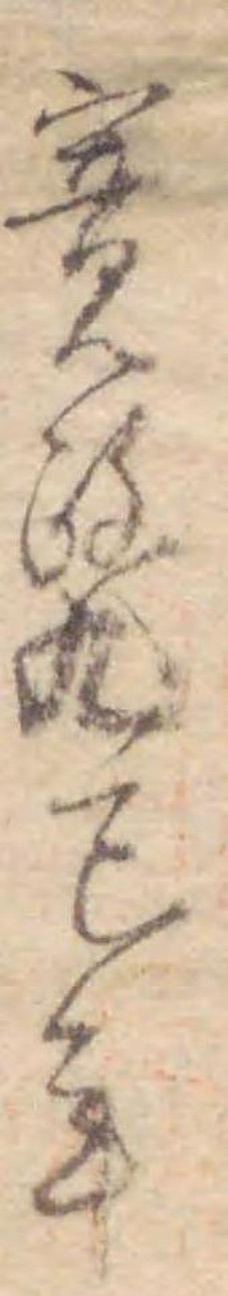寛政九巳年
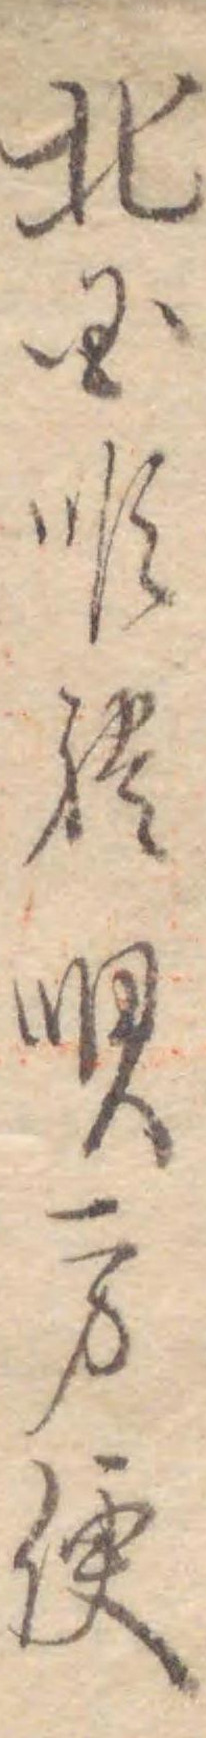北国順礼唄方便
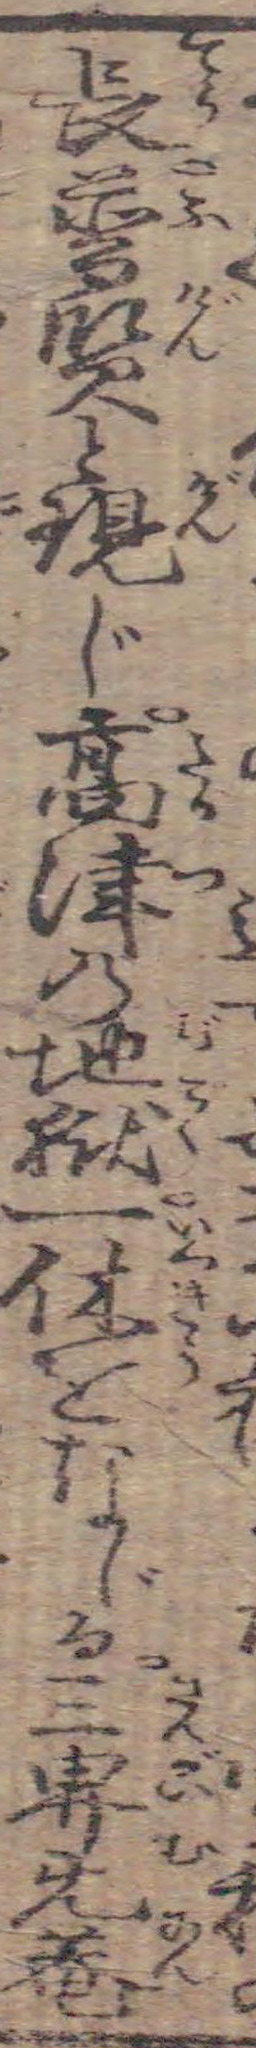長普賢と現じ。高津の地獄一休をなじる。三界無菴
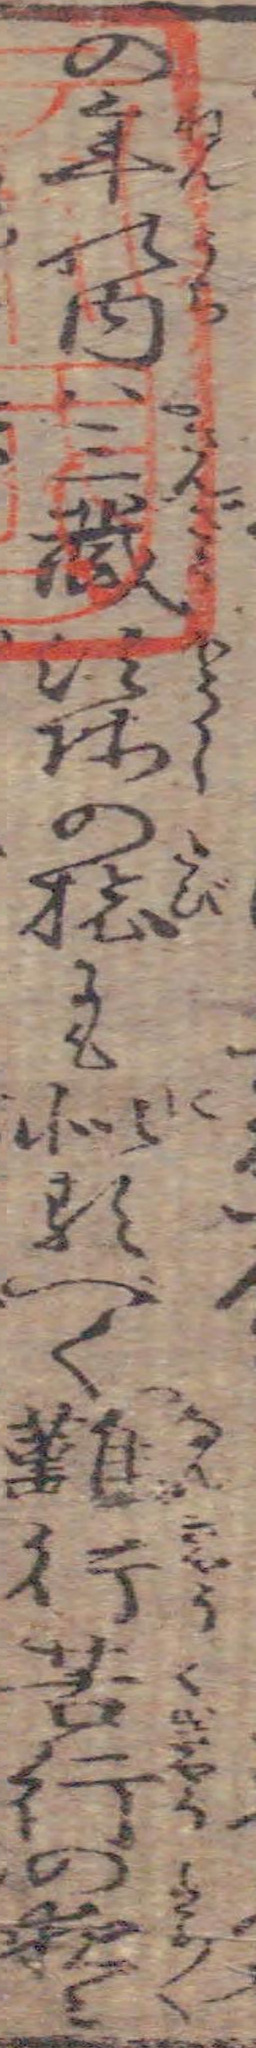の年の内は。三蔵法様の旅にも似るべく。難行苦行の夜々
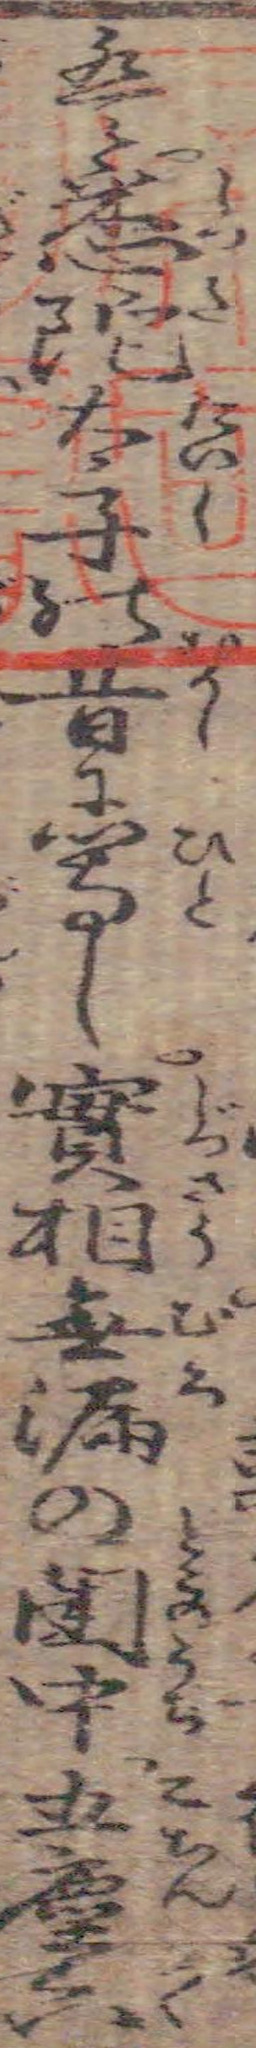は。悉陀太子の昔に等し実相無漏の閨中。五塵六
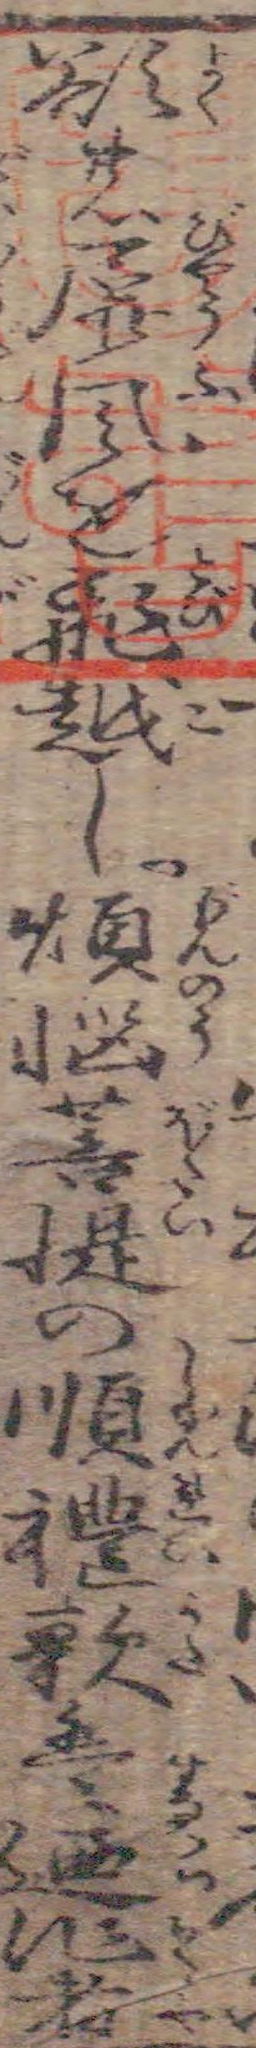欲の屏風を飛越し。煩悩菩提の順礼歌は廼作者
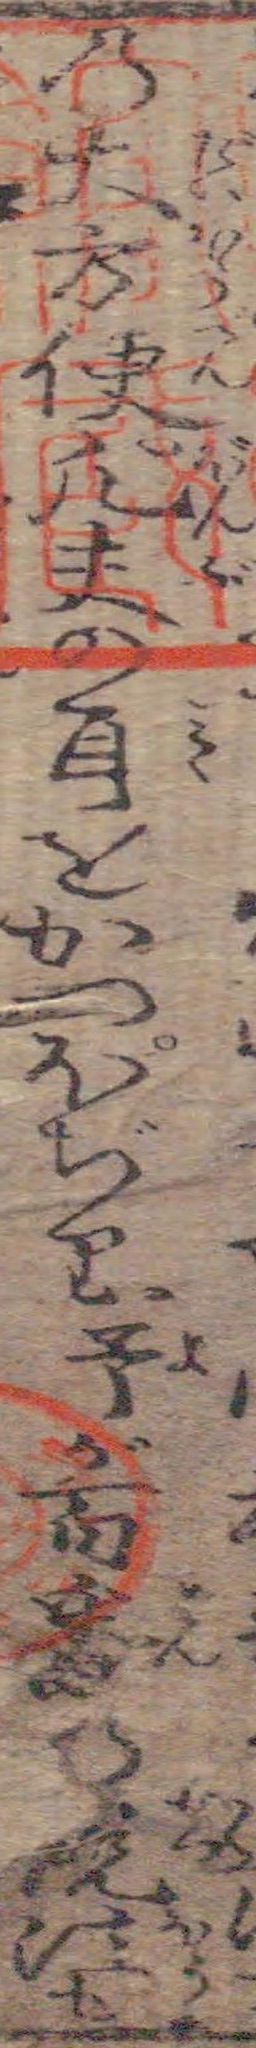の大方使。凡夫の耳をかつぽぢり。予が百番の説法も
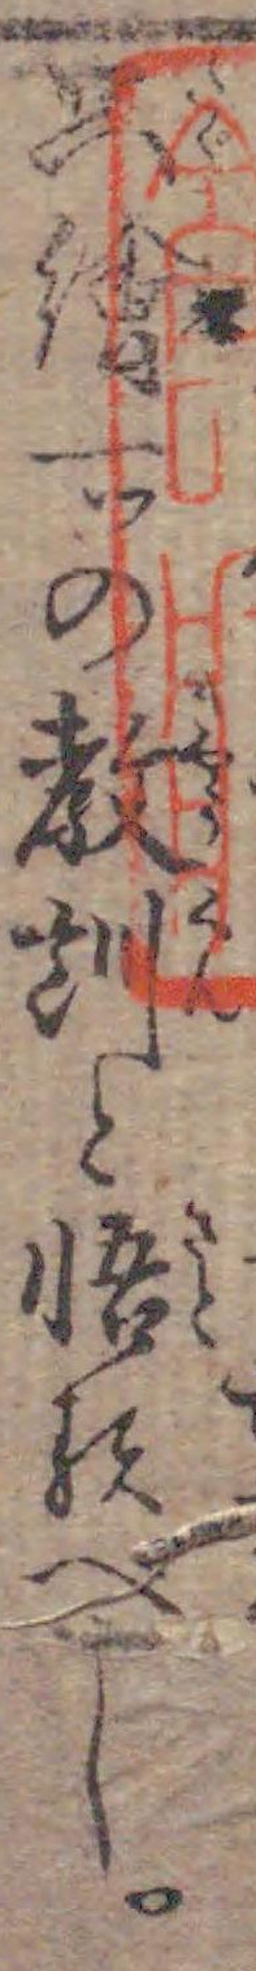只絵一つの教訓と悟るべし。
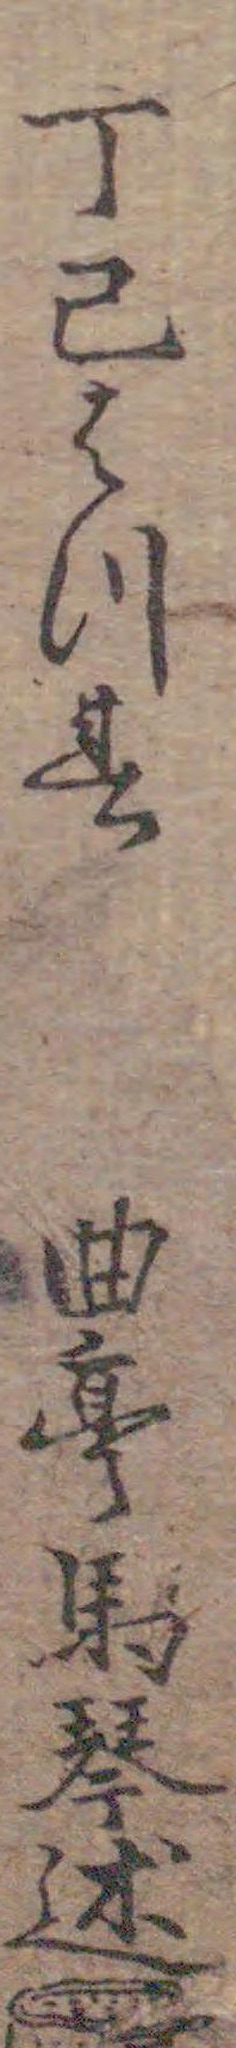丁巳はつ春曲亭馬琴述

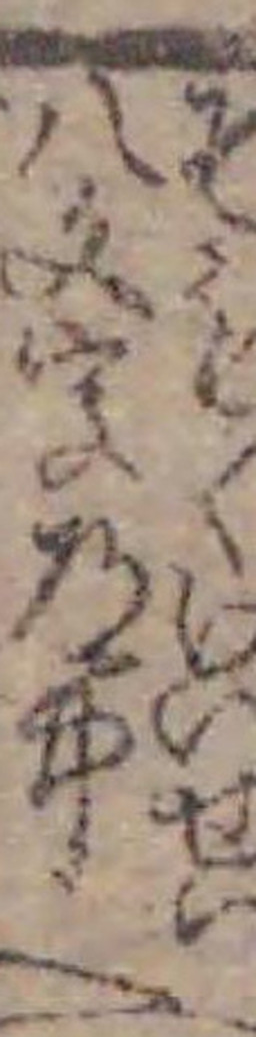八文字道中
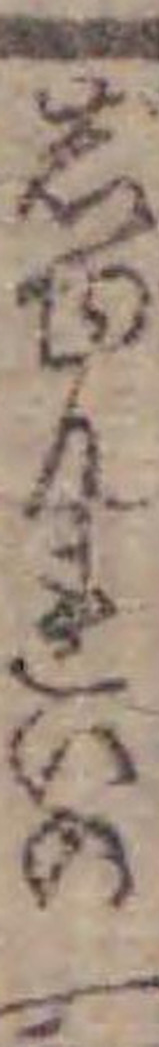じゆんれいの
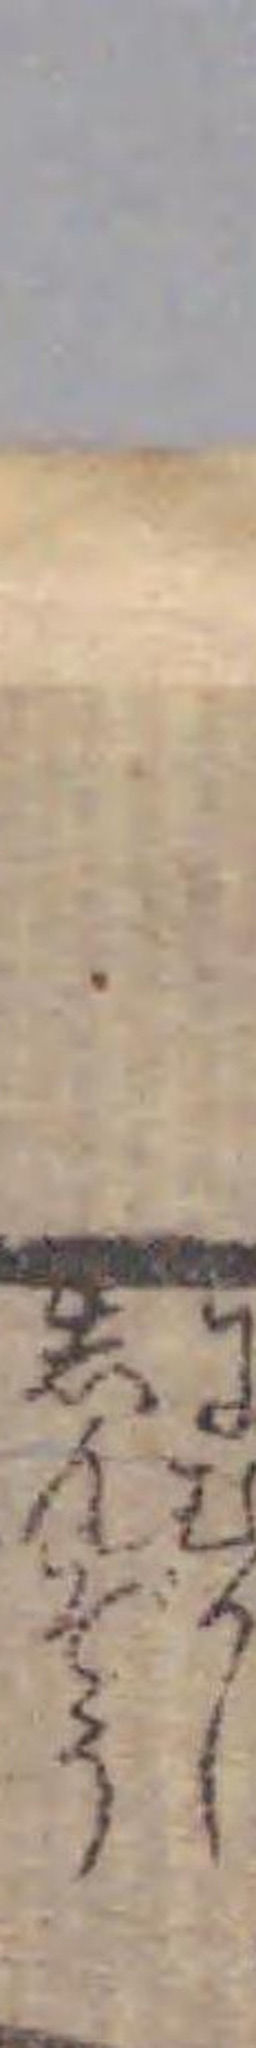しんぞう
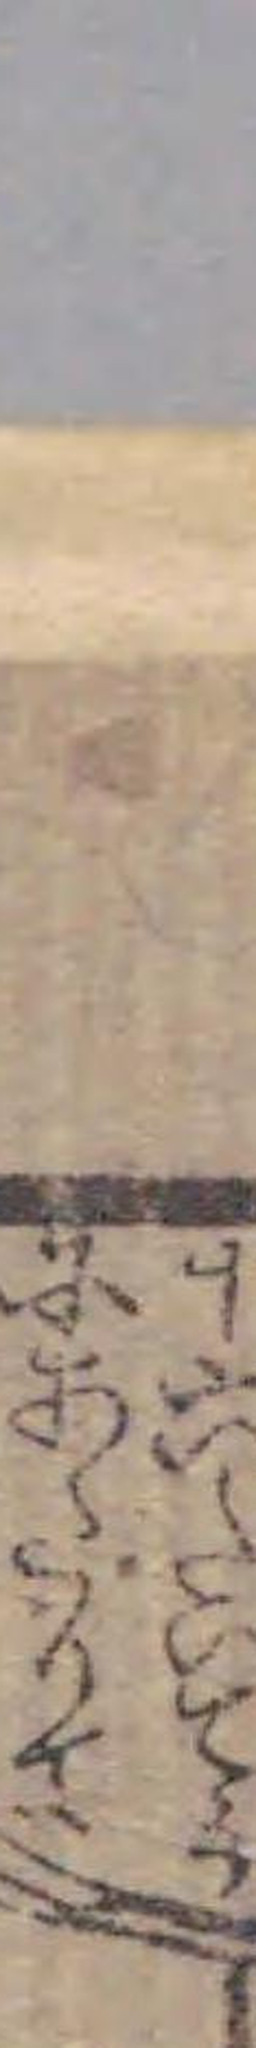にあたりて
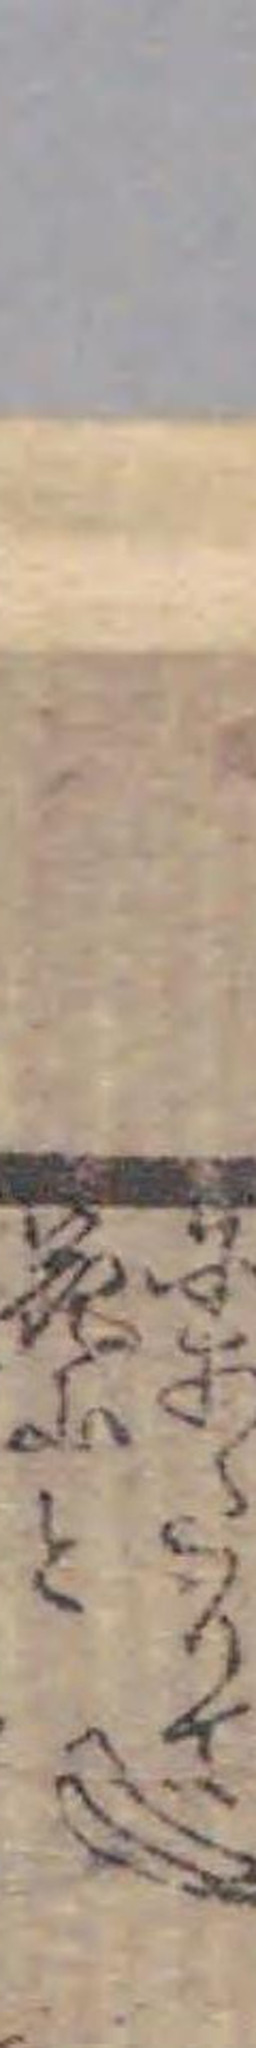花山と
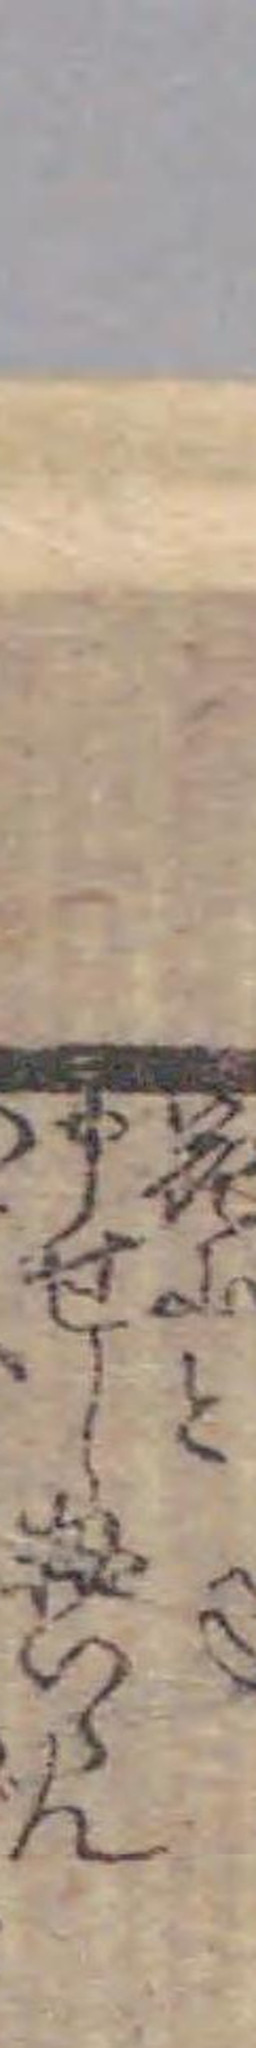申せしおいらん
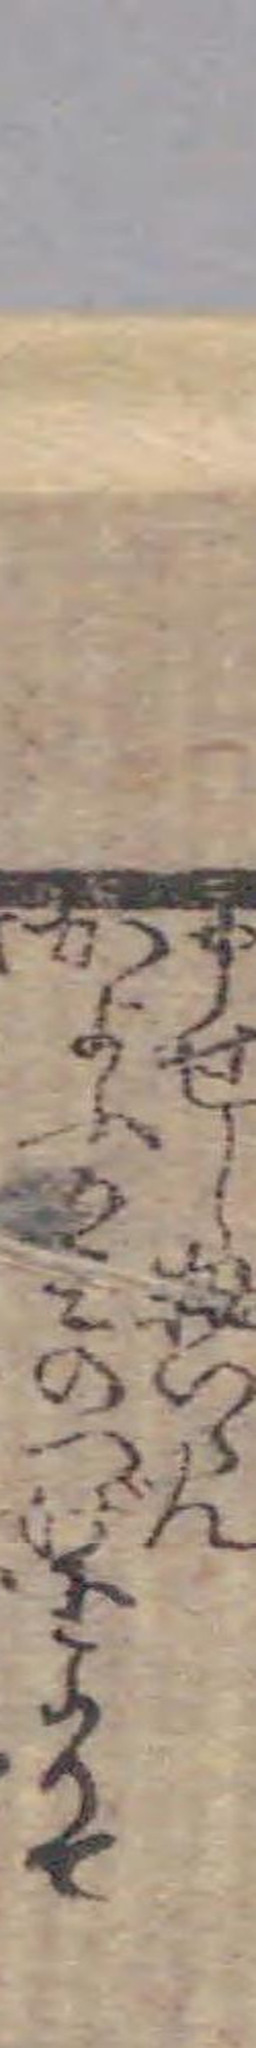かよふかみのつげによりて
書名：北国順礼唄方便 : 3巻
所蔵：国立国会図書館 National Diet Library, JAPAN
